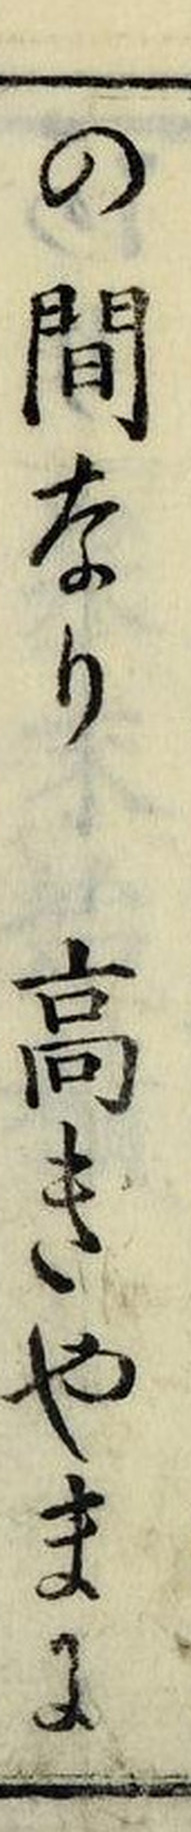の間なり高き山に
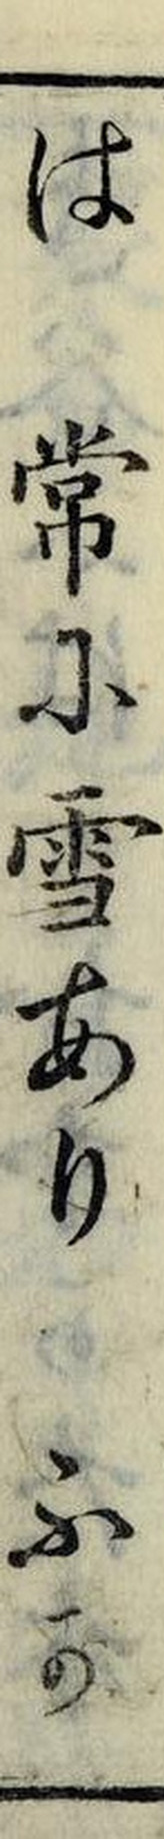は常に雪ありふか

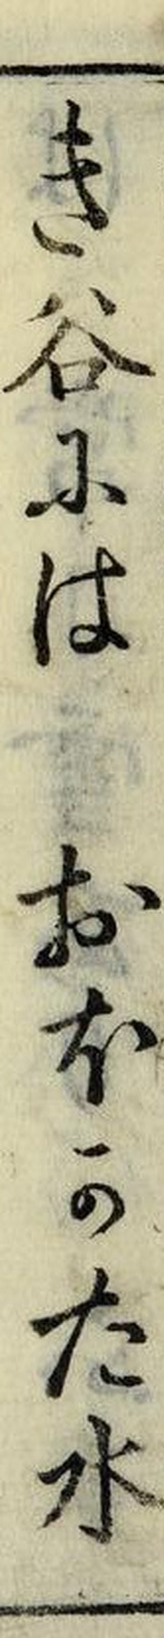き谷にはおほかた水
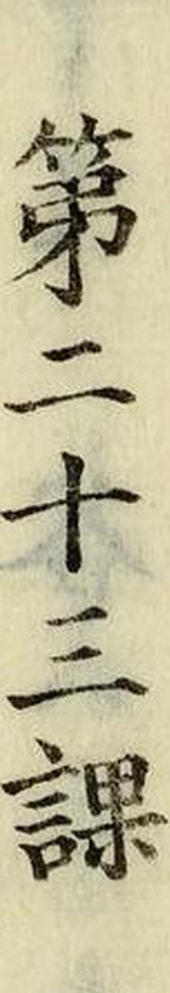第二十三課
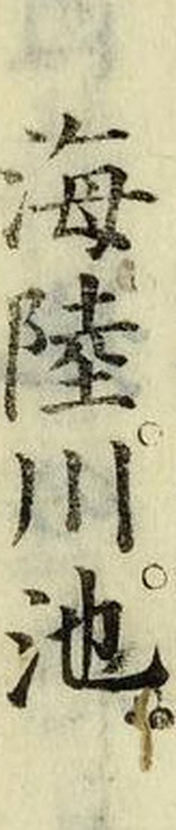海。陸。川。池。
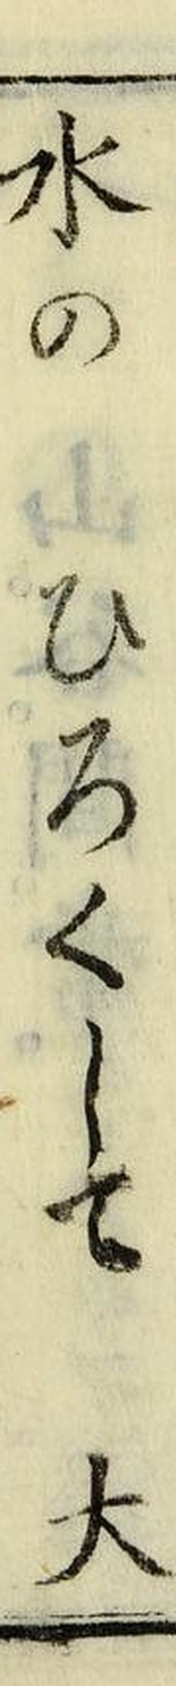水のひろくして大
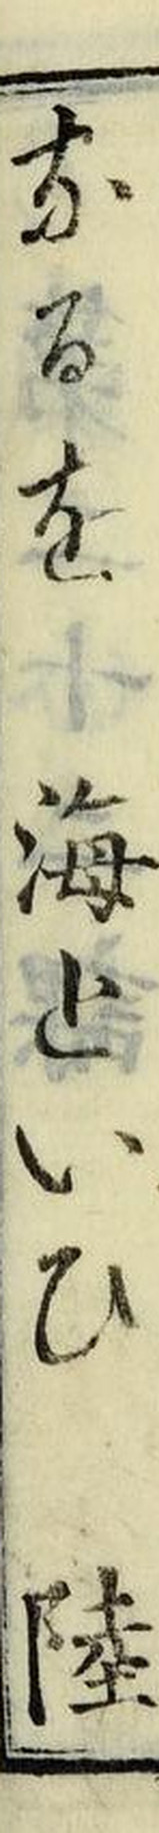なるを海といひ陸
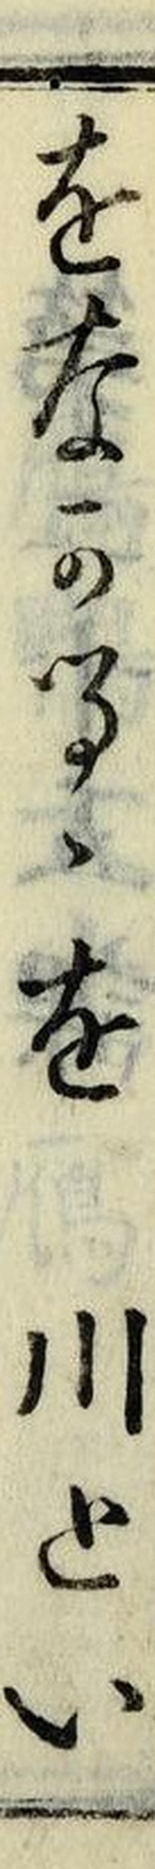をなかるゝを川とい
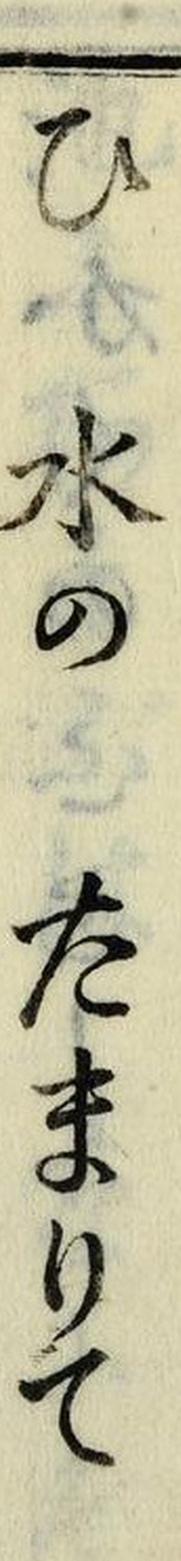ひ水のたまりて
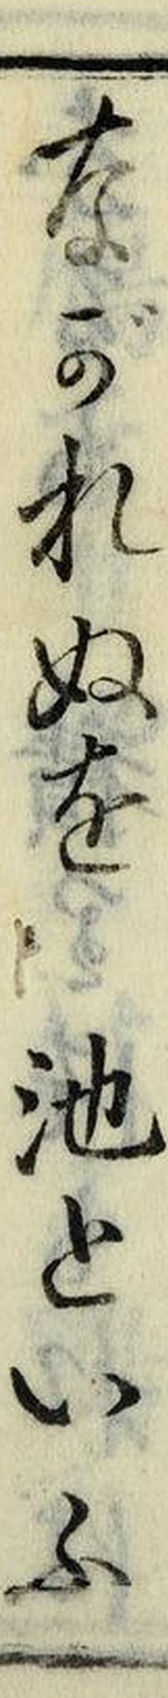ながれぬを池といふ
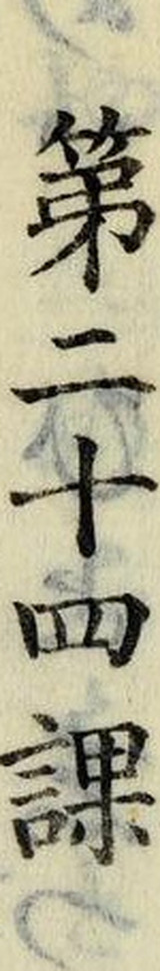第二十四課
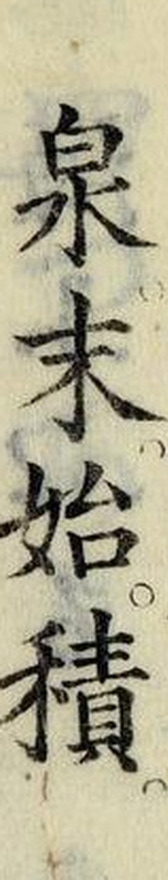泉。末。始。積。
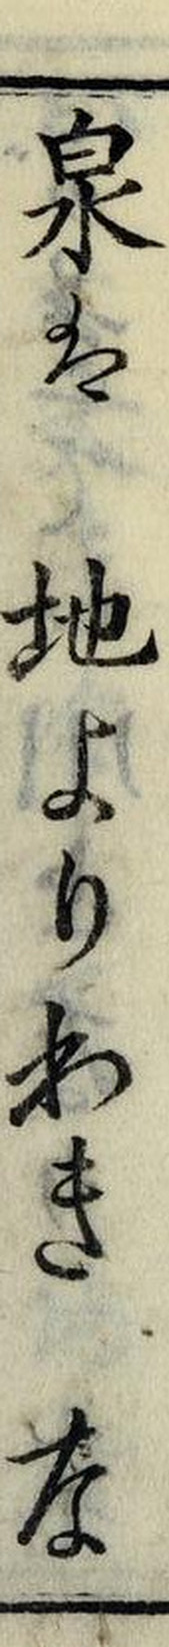泉は地よりわきな

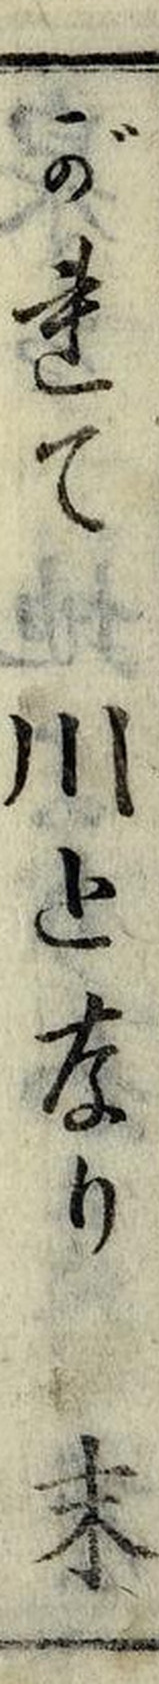がれて川となり末
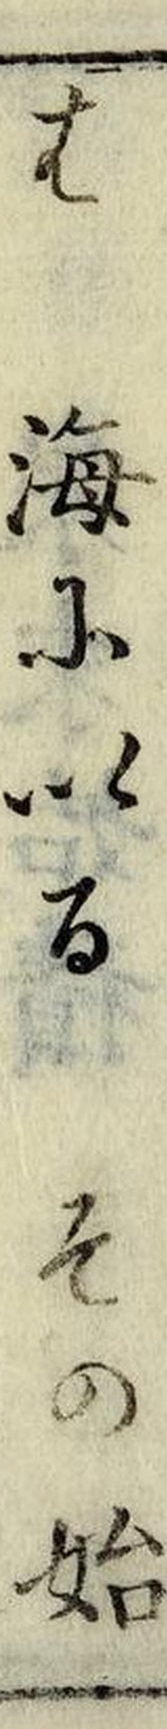は海にいるその始
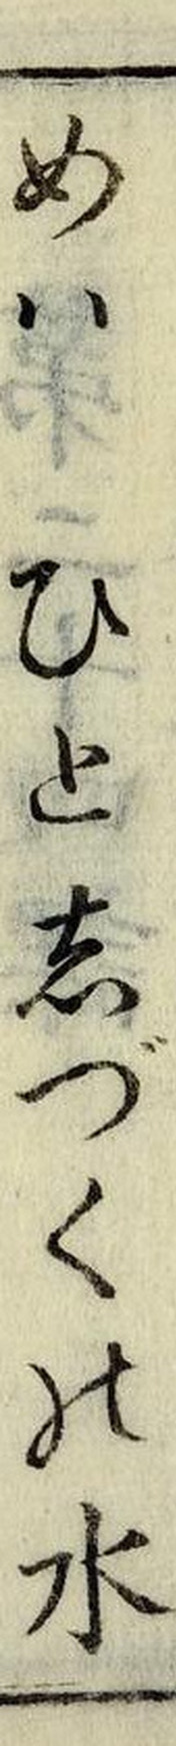めはひとしづくの水
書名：小学読本 初等科 巻一
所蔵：福井県文書館 Fukui Prefectural Archives
